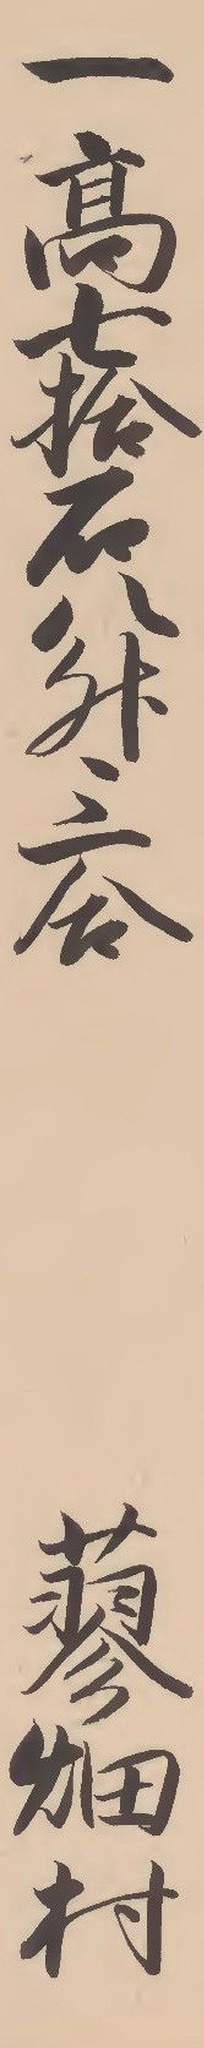一高七拾石八升三合蓼畑村
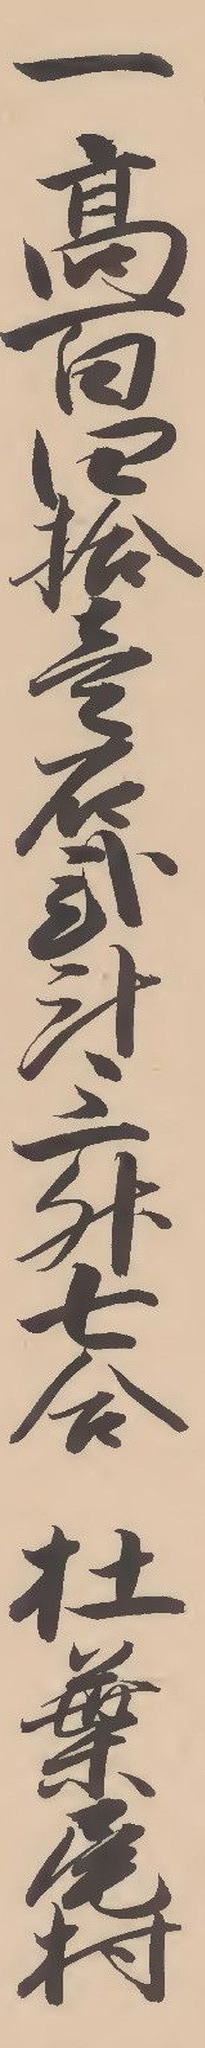一高百四拾壱石弐斗三升七合杜葉尾村
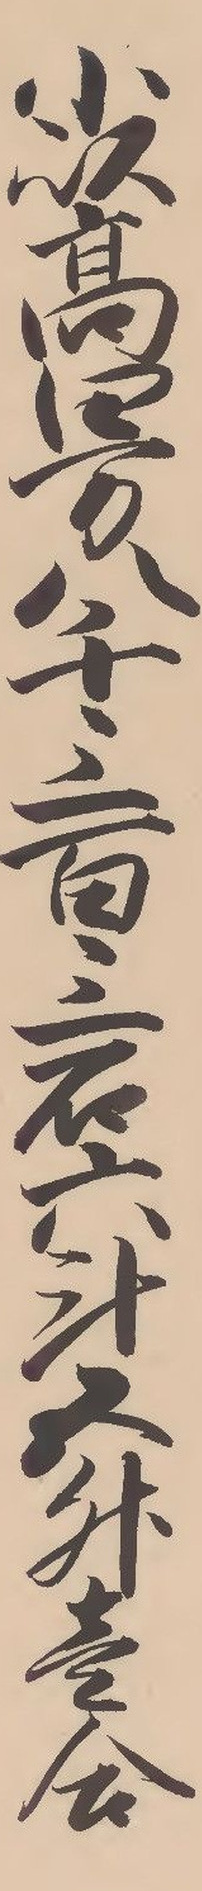小以高四万八千三百三石六斗五升壱合

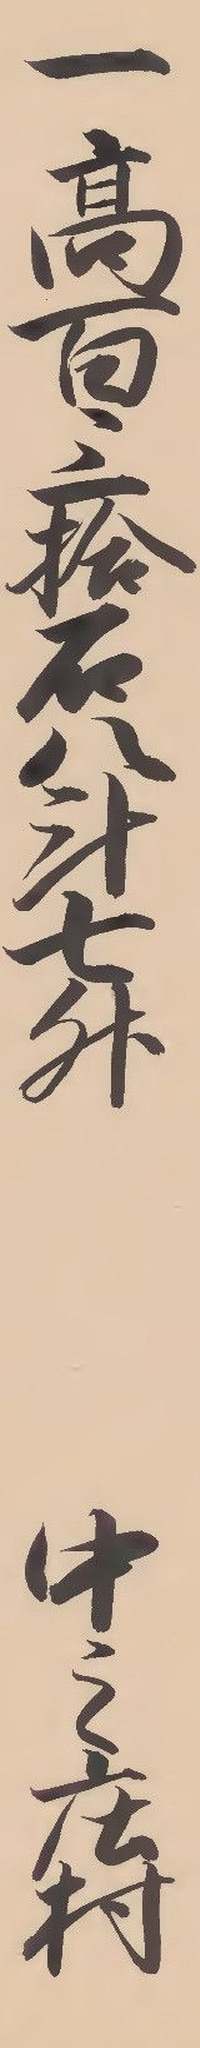一高百三拾石八斗七升中之庄村
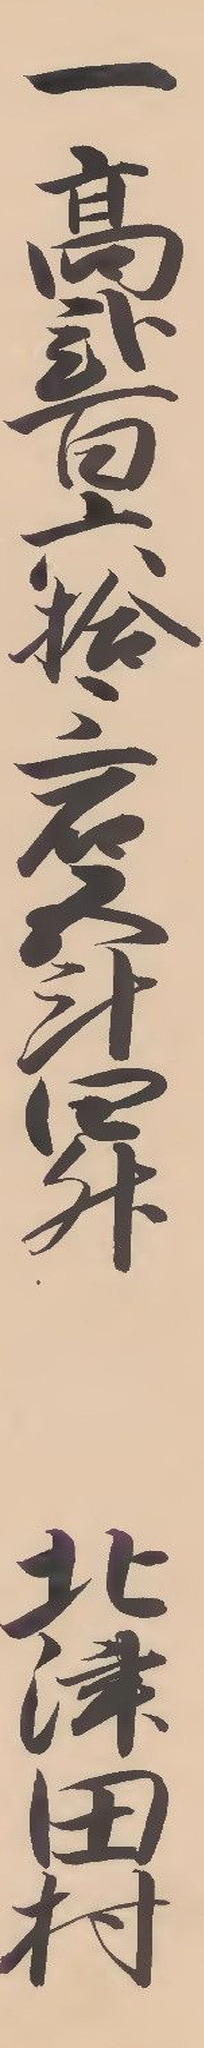一高弐百六拾三石五斗四升北津田村

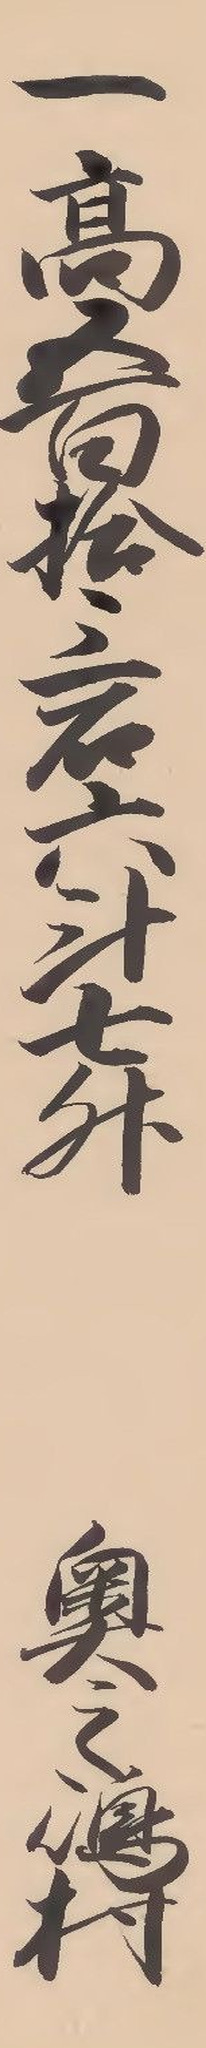一高五百拾三石六斗七升奥之島村
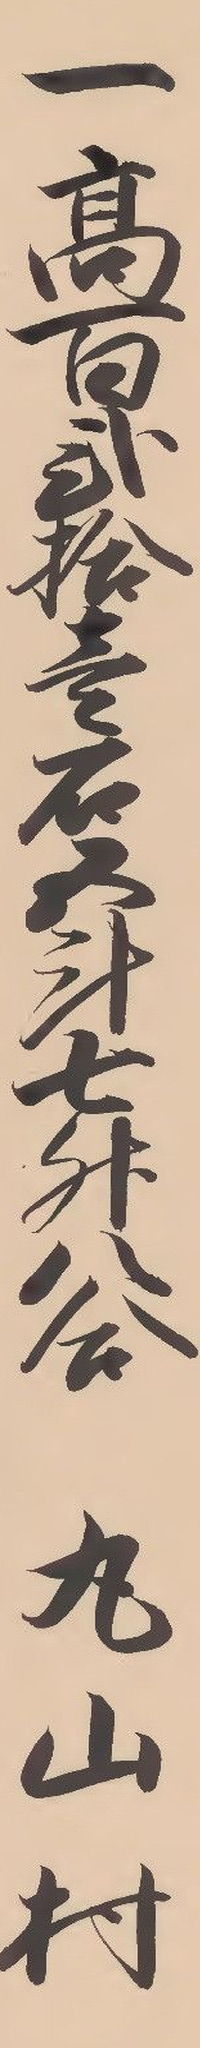一高百弐拾壱石五斗七升八合丸山村
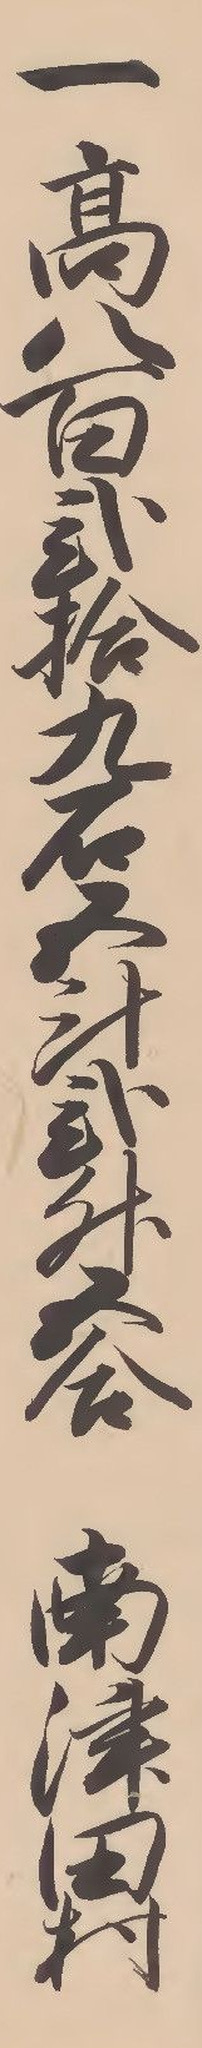一高八百弐拾九石五斗弐升五合南津田村
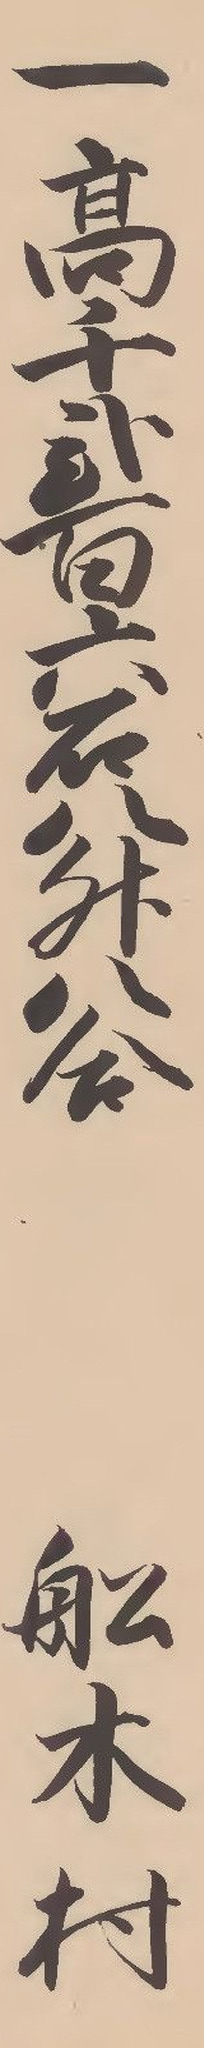一高千弐百六右八升八合船木村
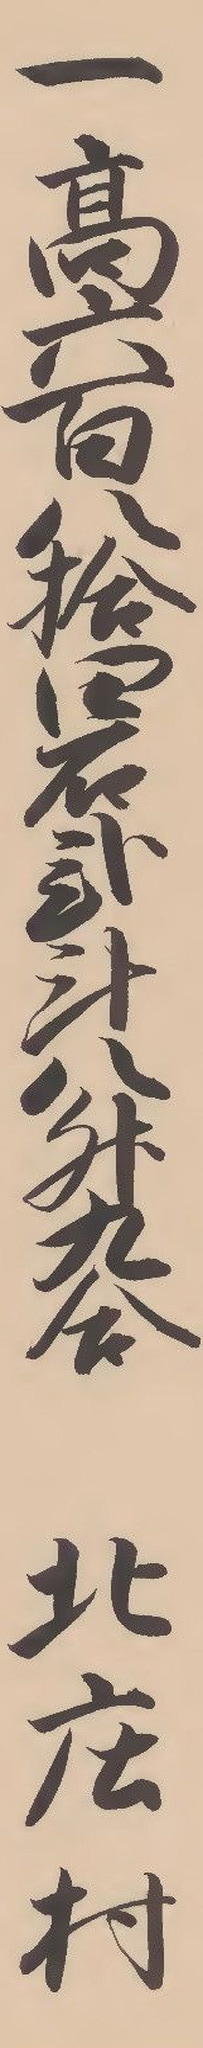一高六百八拾四石弐斗八升九合北庄村
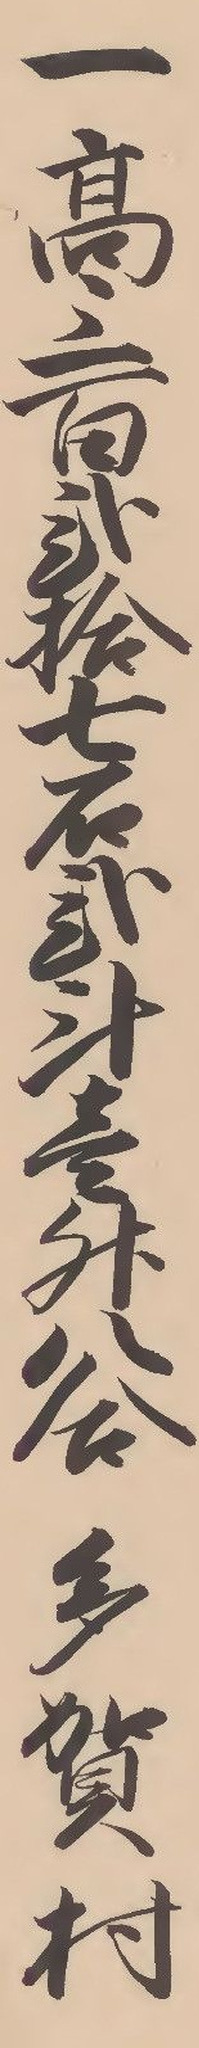一高三百弐拾七石弐斗壱升八合多賀村

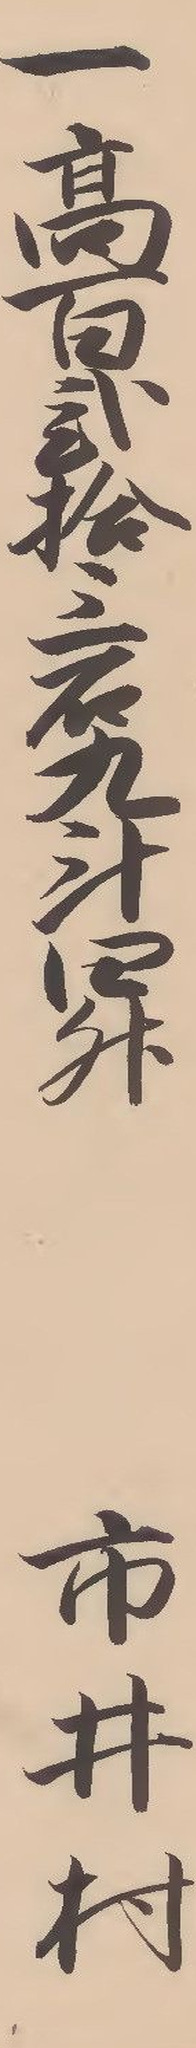一高百弐拾三石九斗四升市井村
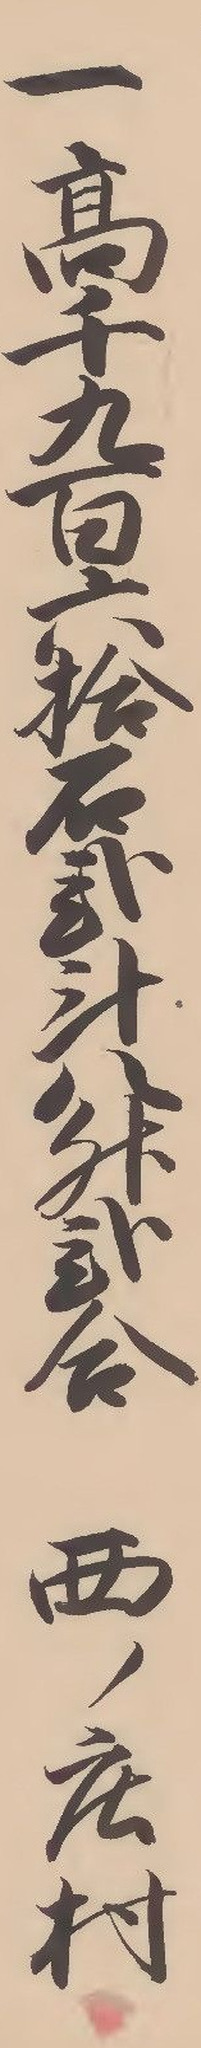一高千九百六拾石弐斗八升弐合西ノ庄村
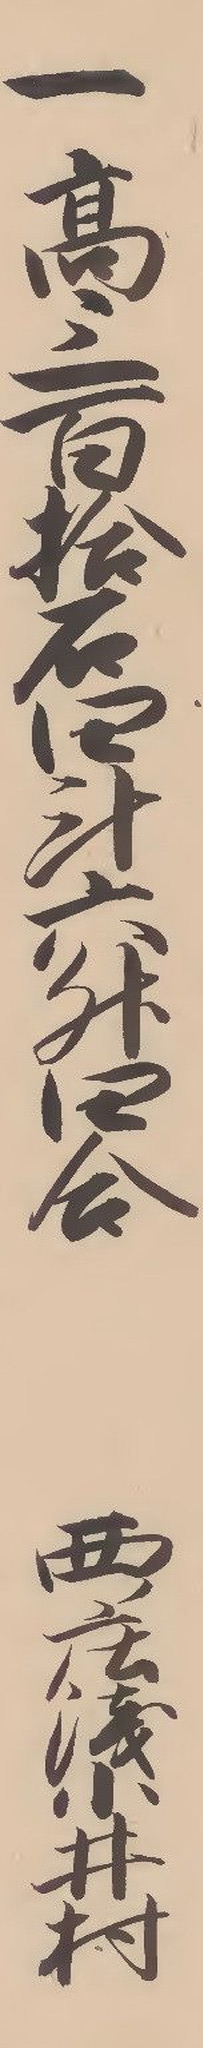一高三百拾石四斗六升四合西ノ庄浅小井村
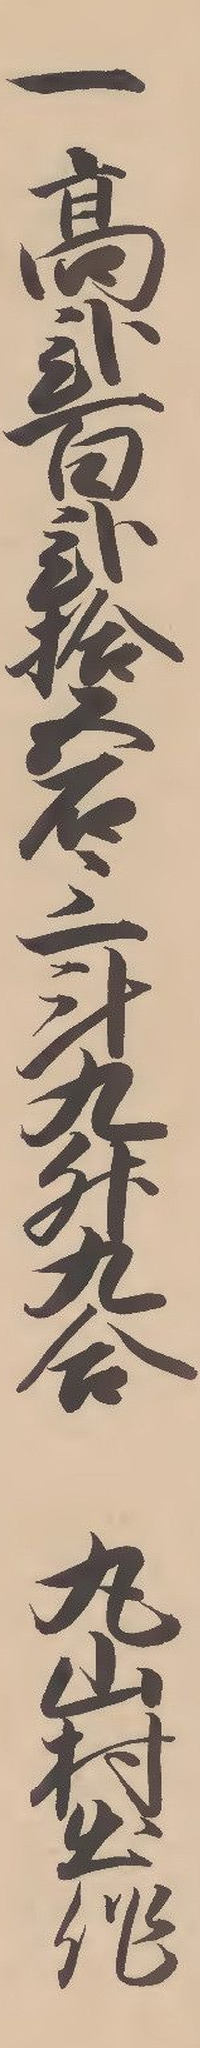一高弐百弐拾五石三斗九升九合丸山村出作
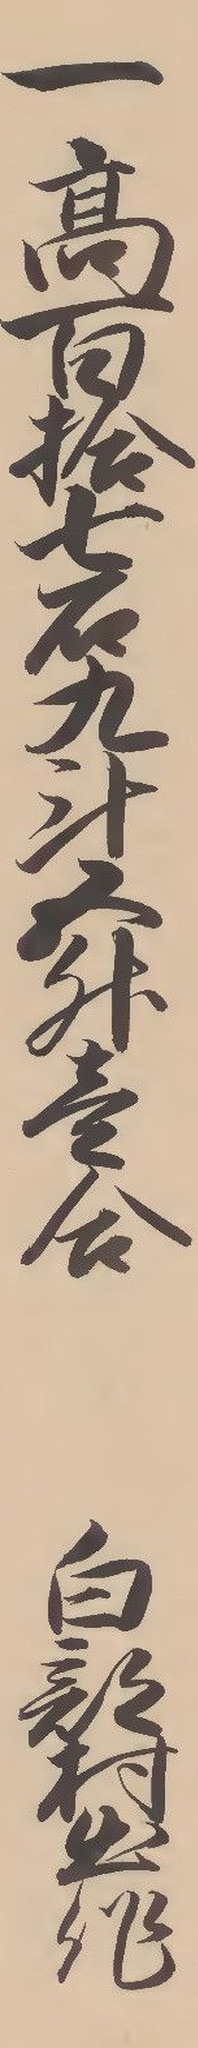一高百拾七石九斗五升壱合白部村出作
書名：近江国郷帳
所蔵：国立公文書館 National Archives of Japan
